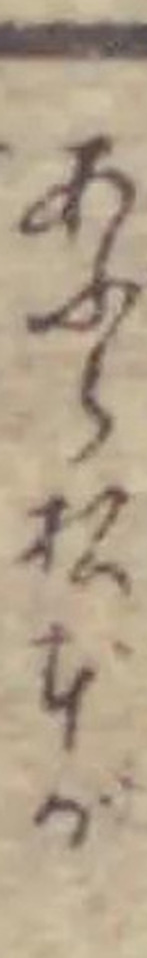あぶら松本が
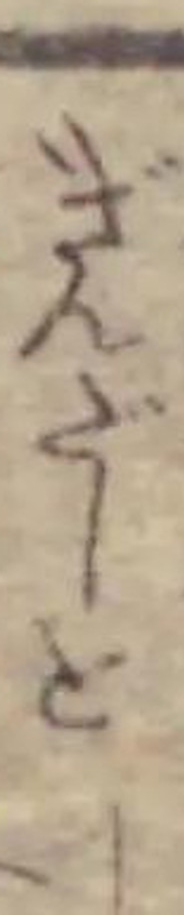ぎんだしを
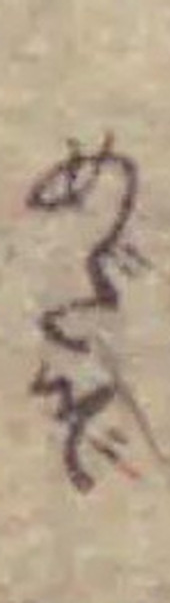めだぞ
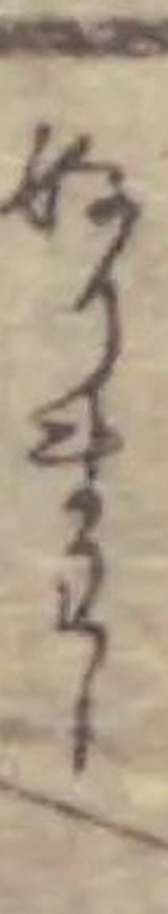ぬりまわし
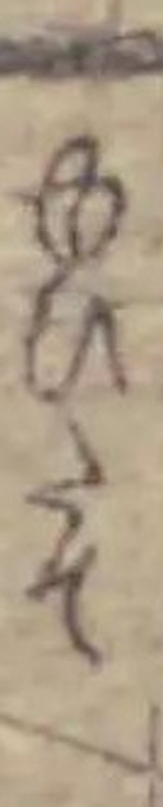ゆひたて
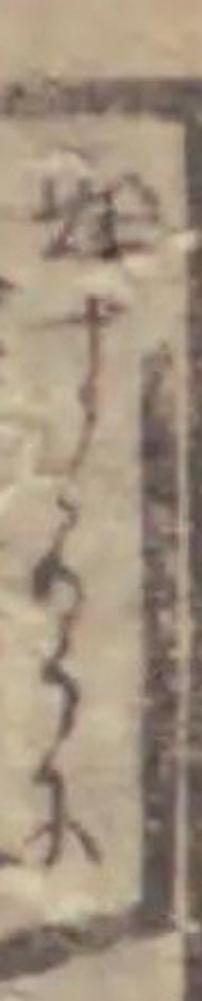出すやうに
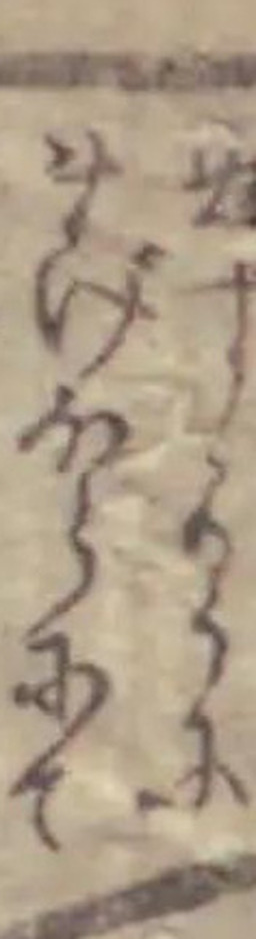まげほらにて
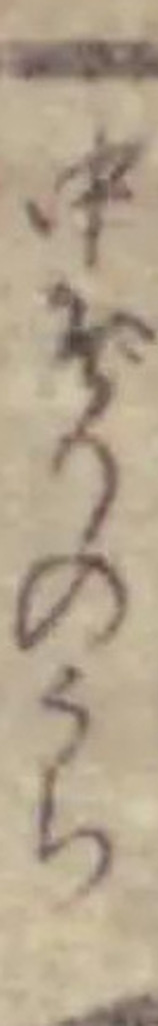中ぞりのうち
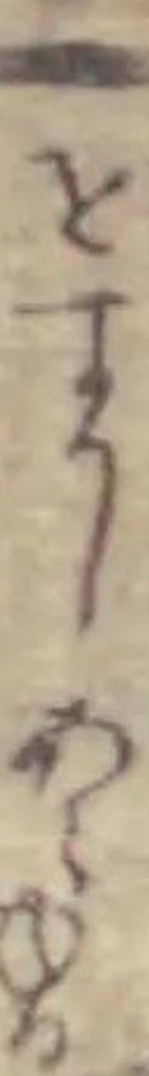をすかしあらゆる
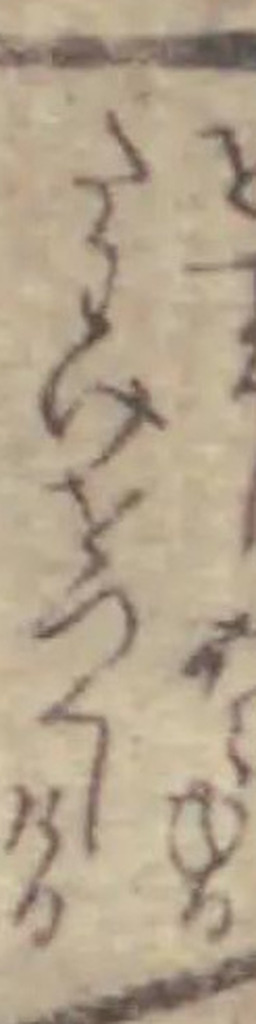たわけをつくしける
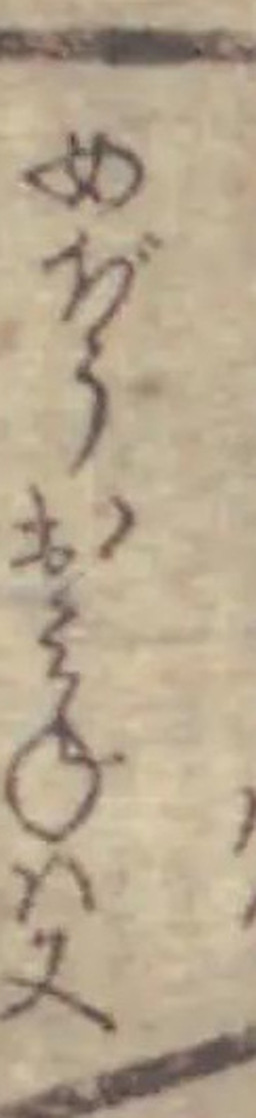女ぼうおみねは又
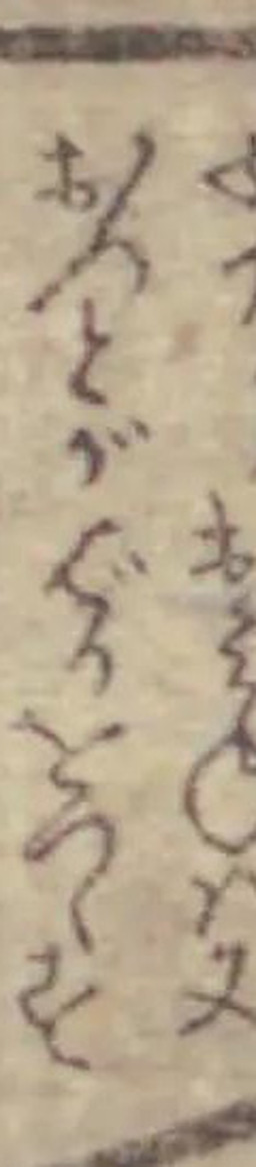おつとがばかをつくす
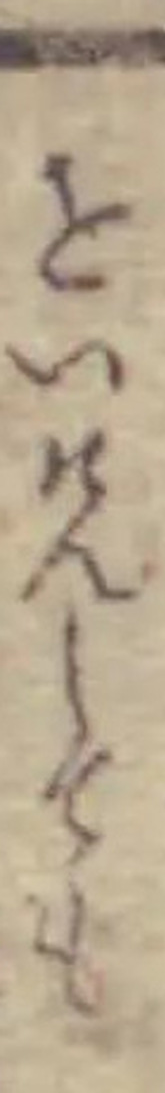をいけんしても
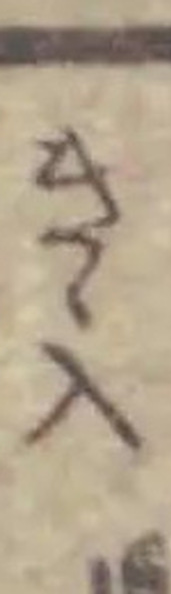きゝ入
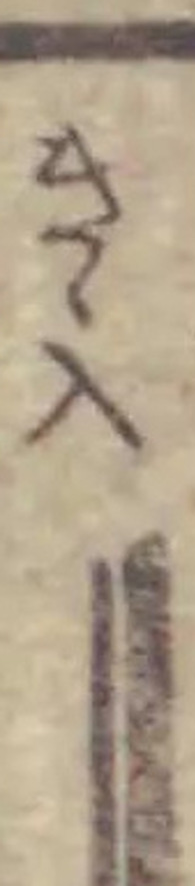きゝ入
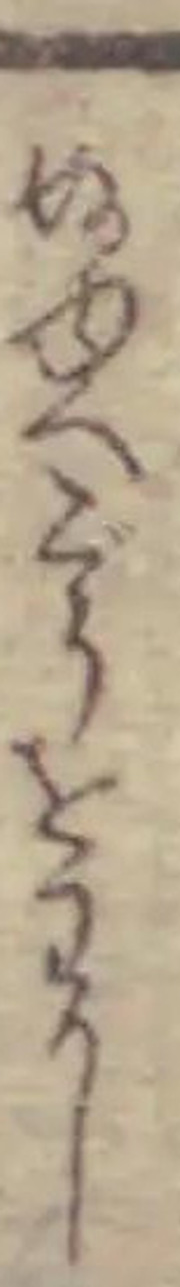ぬゆへごうをわかし
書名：飛た間違矢口噂 2巻
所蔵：国立国会図書館 National Diet Library, JAPAN
